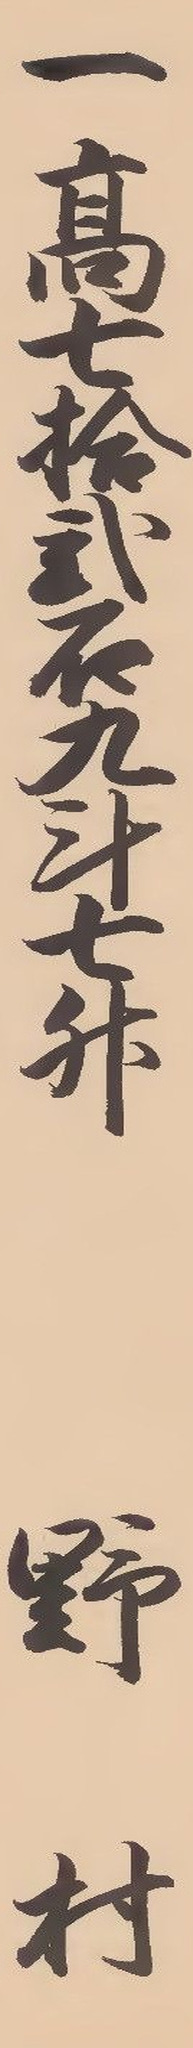一高七拾弐石九斗七升野村
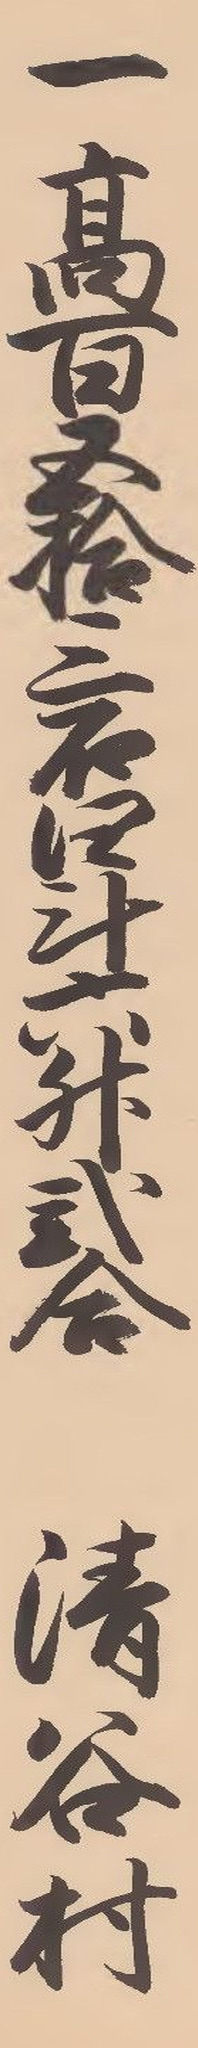一高百五拾三石四斗六升弐合清谷村
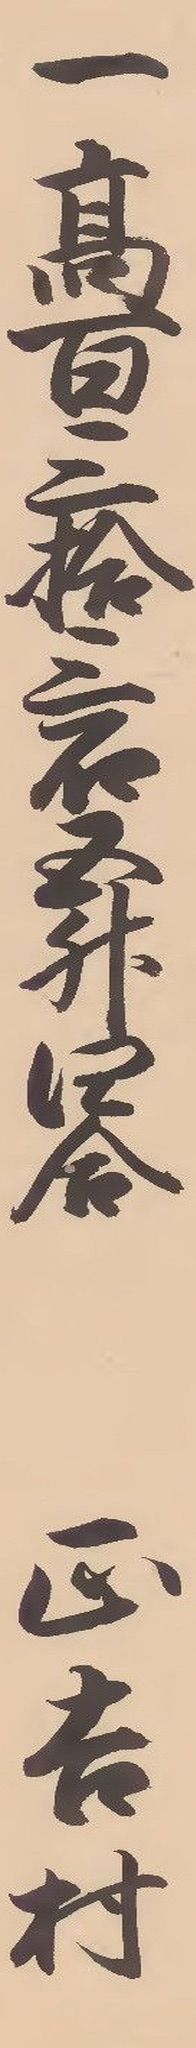一高百三拾三石五升四合正吉村

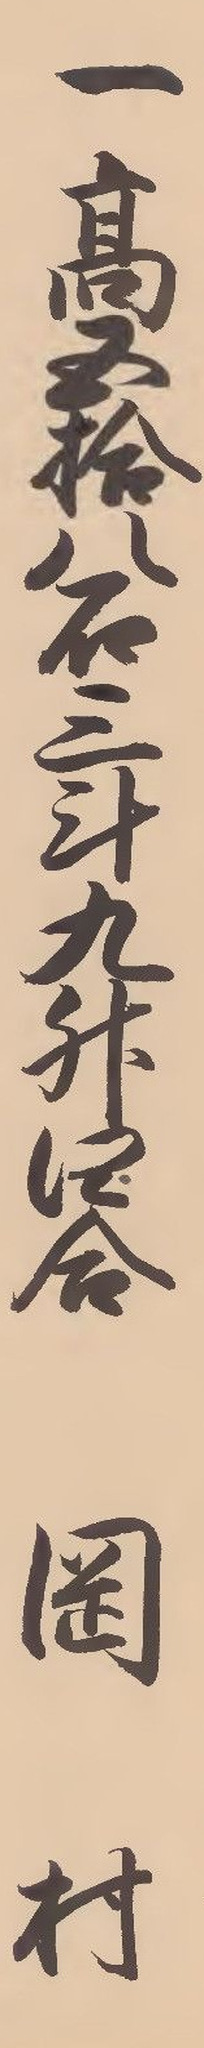一高五拾八石三斗九升四合岡村
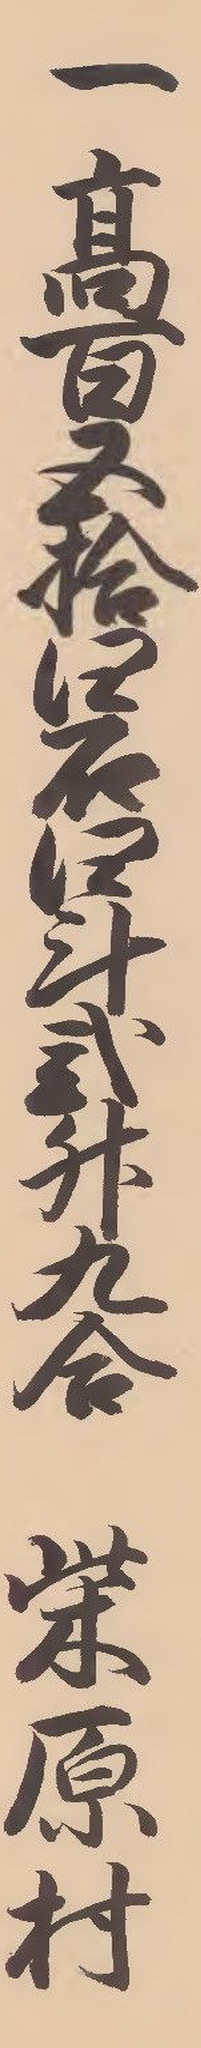一高百五拾四石四斗弐升九合柴原村
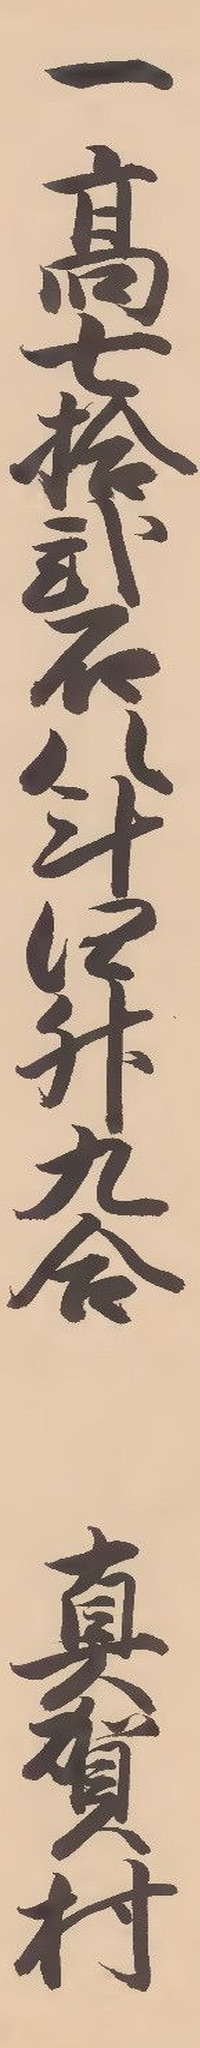一高七拾弐石八斗四升九合真賀村
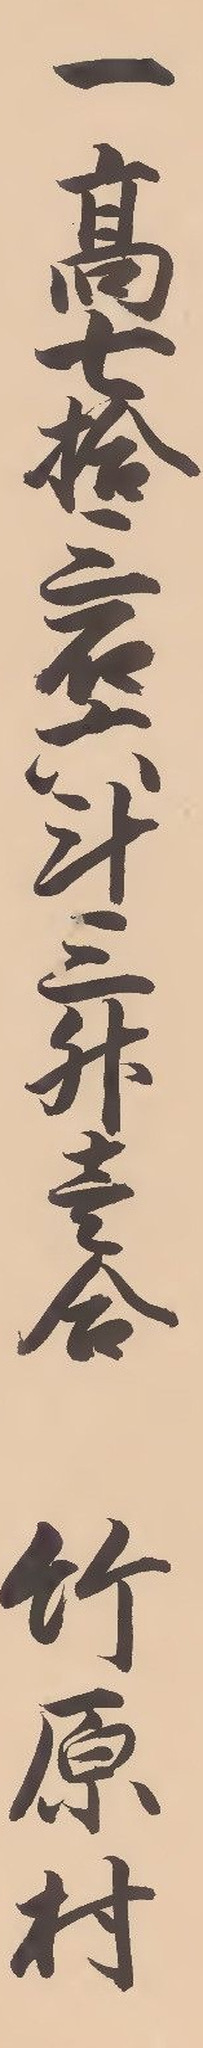一高七拾三石六斗三升壱合竹原村
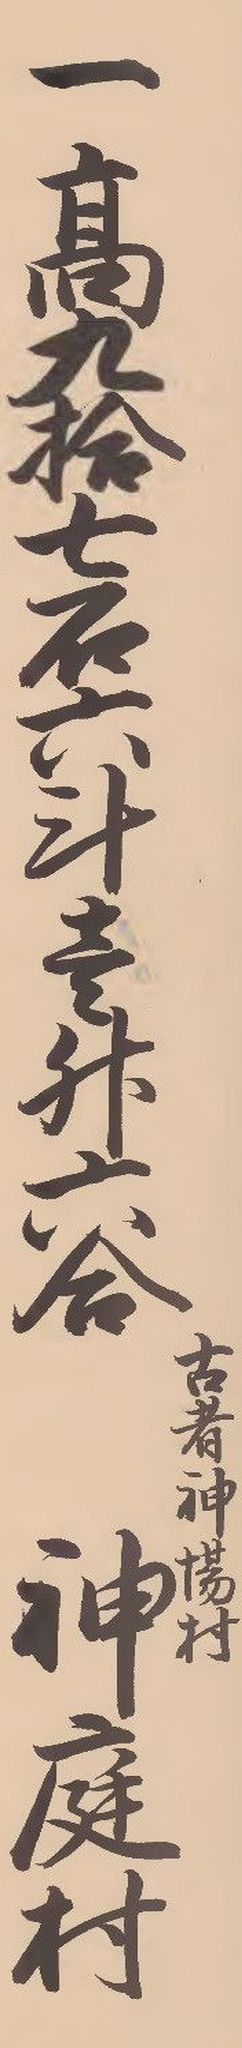一高四拾七石六斗四升星山村
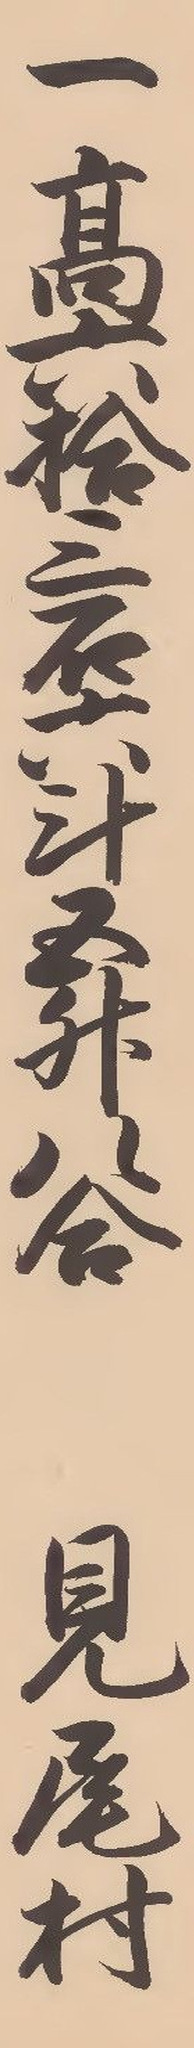一高六拾三石六斗五升八合見尾村
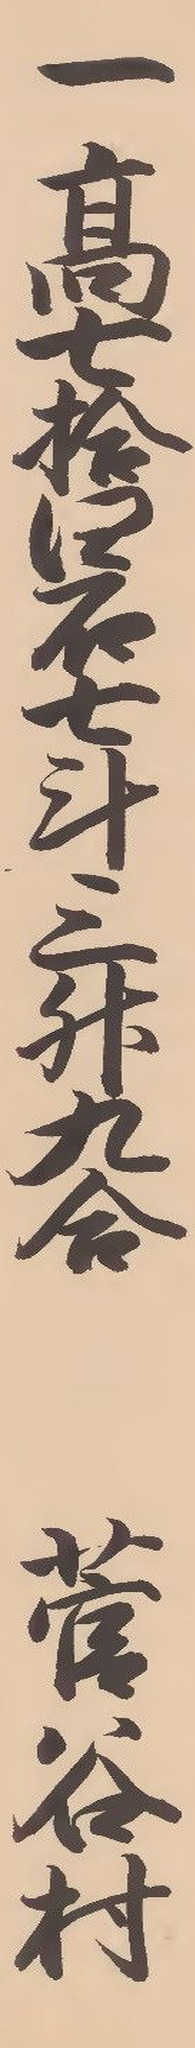一高七拾四石七斗三升九合菅谷村
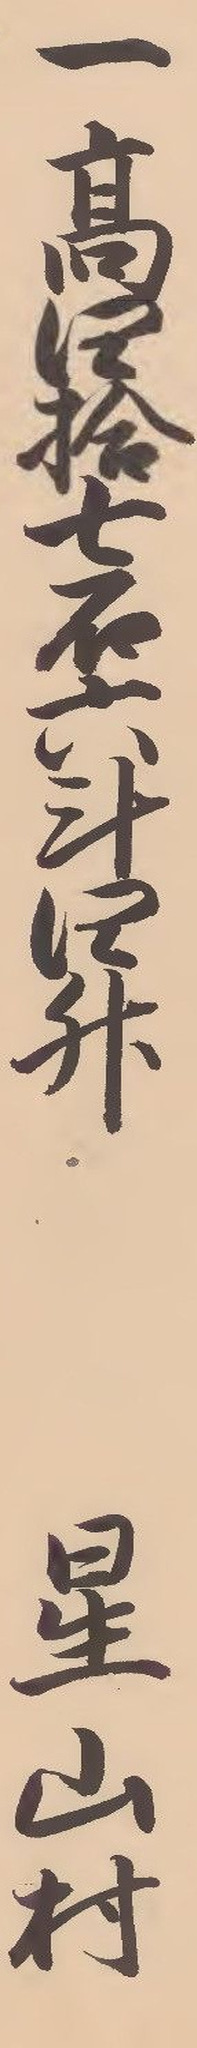一高四拾七石六斗四升星山村

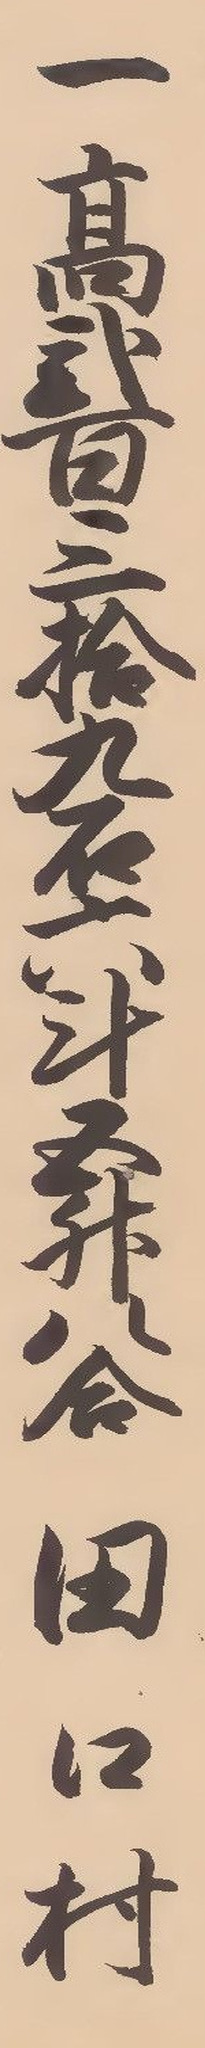一高弐百三拾九石六斗五升八合田口村
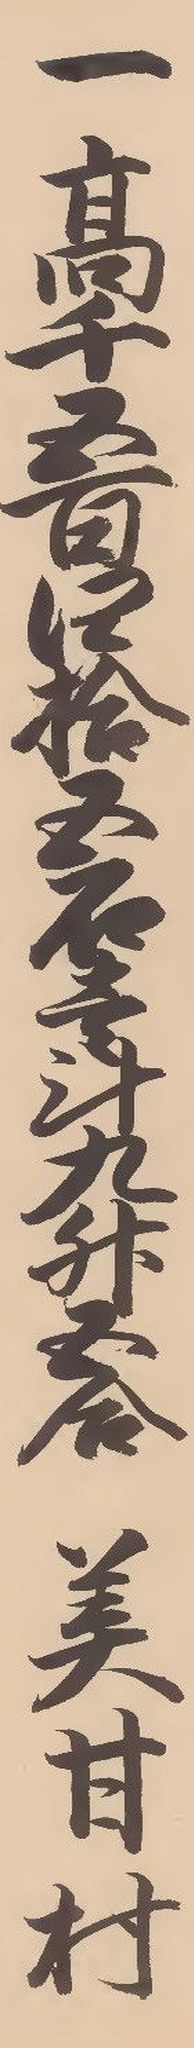一高千五百四拾五石壱斗九升五合美甘村
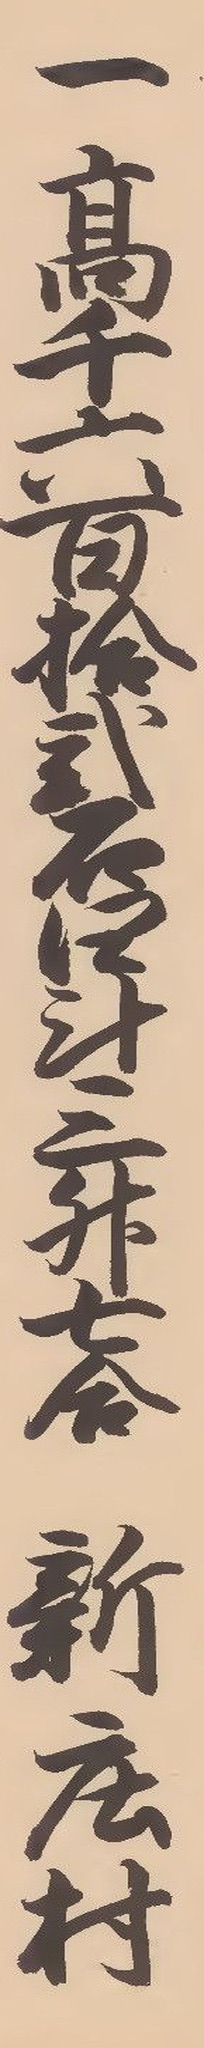一高千六百拾弐石四斗三升七合新庄村
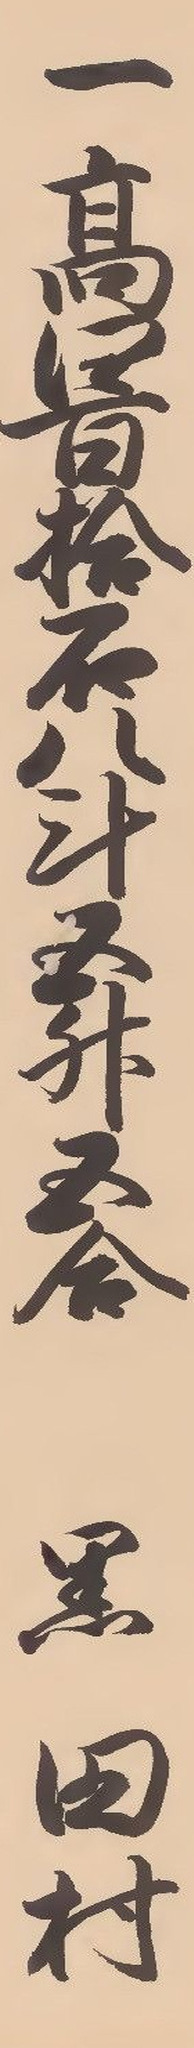一高四百拾石八斗五升五合黒田村
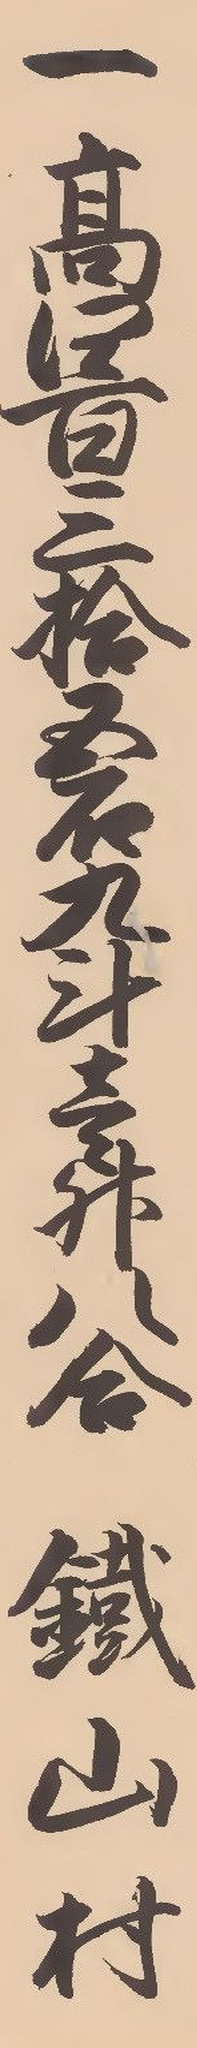一高四百三拾五石九斗壱升八合鉄山村
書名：美作国郷帳
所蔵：国立公文書館 National Archives of Japan
